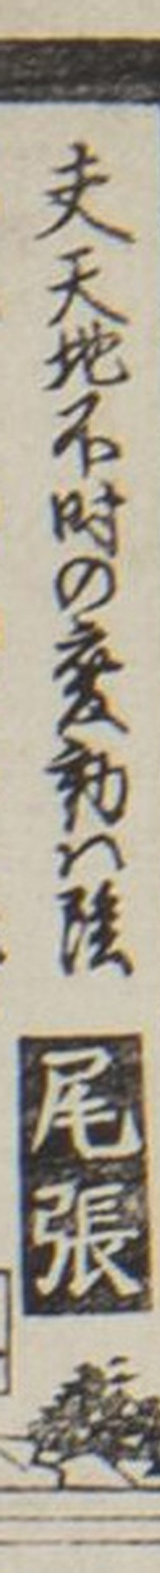夫天地不時の変動は陰
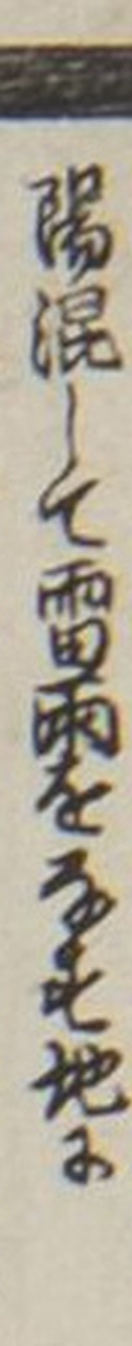陽混して雷雨をなす地に
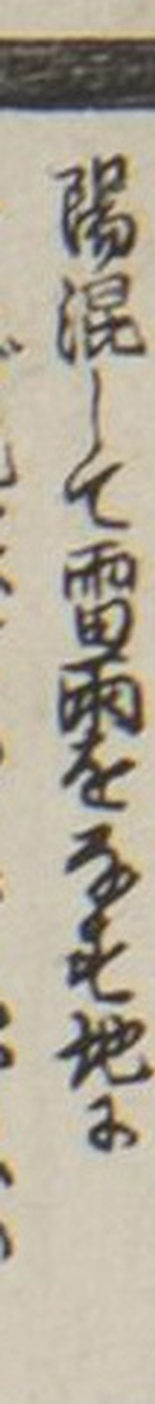陽混して雷雨をなす地に
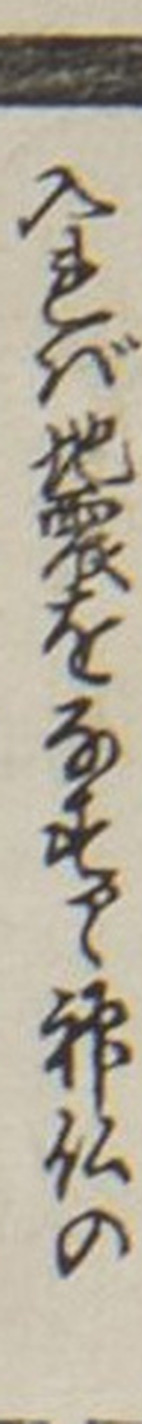入れば地震をなすアゝ神仏の
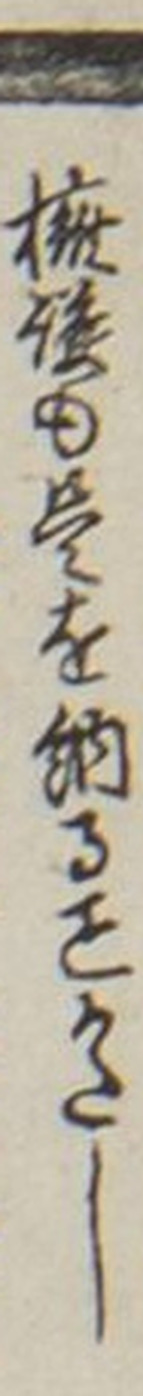庇護も是を納ることかたし
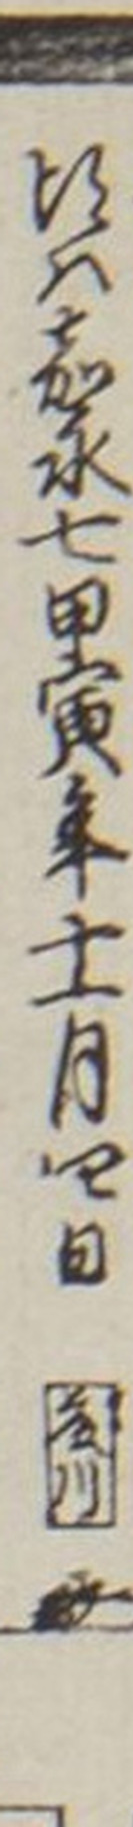頃は嘉永七甲寅年十一月四日
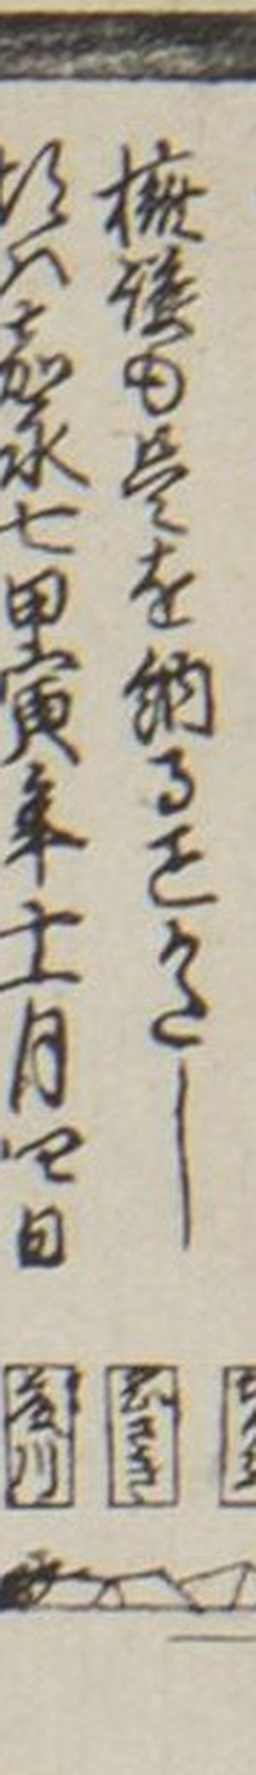頃は嘉永七甲寅年十一月四日
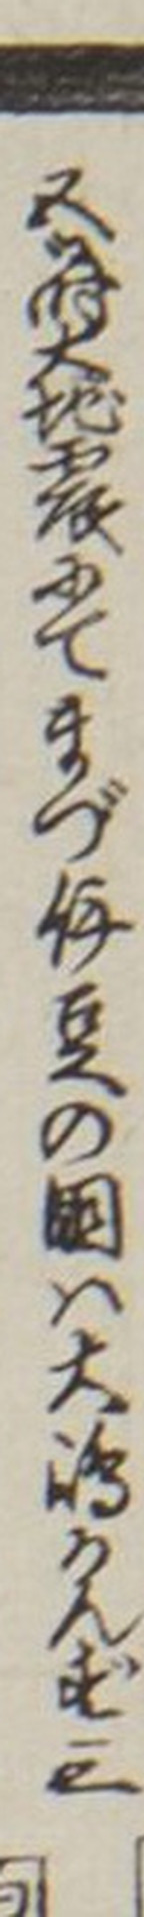五ツ時大地震にてまづ伊豆の国は大島かんず三
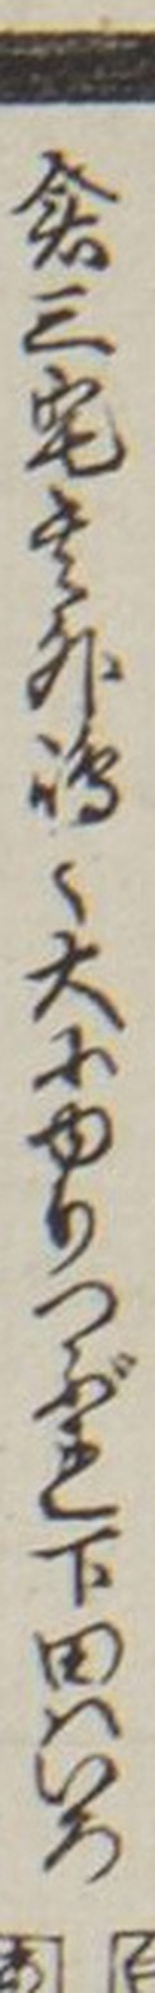倉三宅其外島〳〵大小ゆりつぶれ下田はいろ
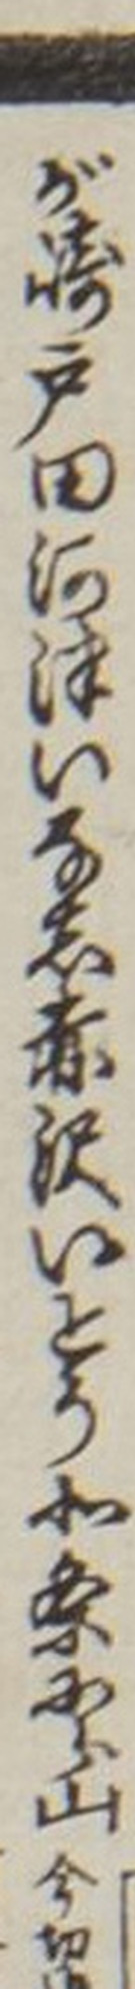が崎戸田河津いなし赤沢いとう北条にら山
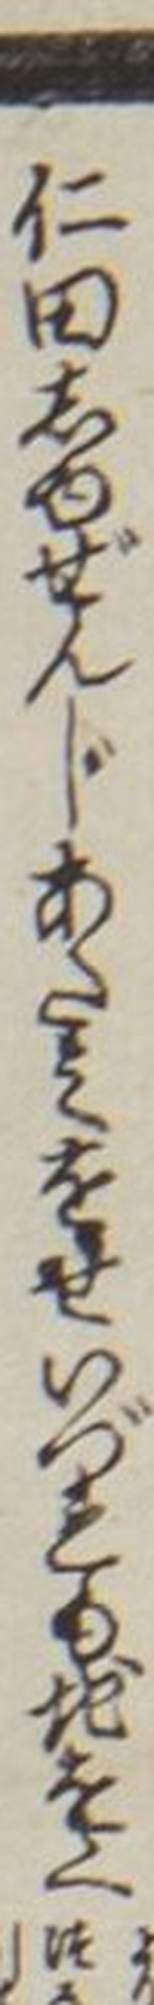仁田しゆぜんじあたみをせいづれも地をく
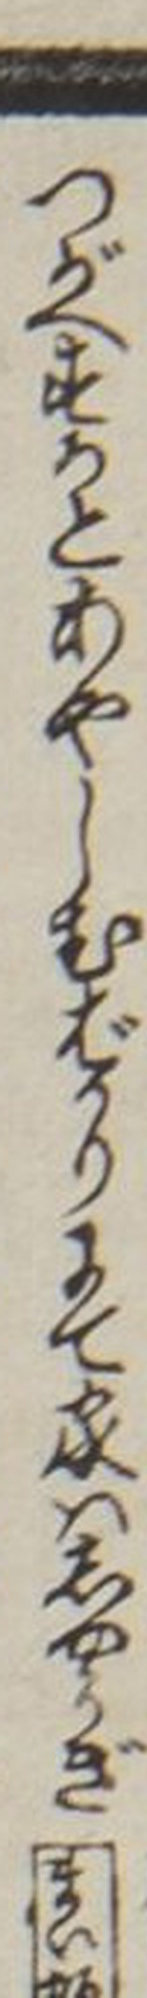つがへすかとあやしむばかりにて家はしやうぎ
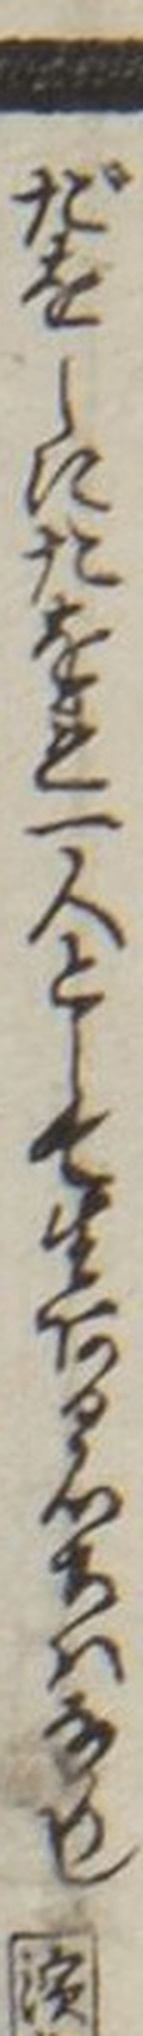だをしにたをれ一人として生ある心ちはなかりし
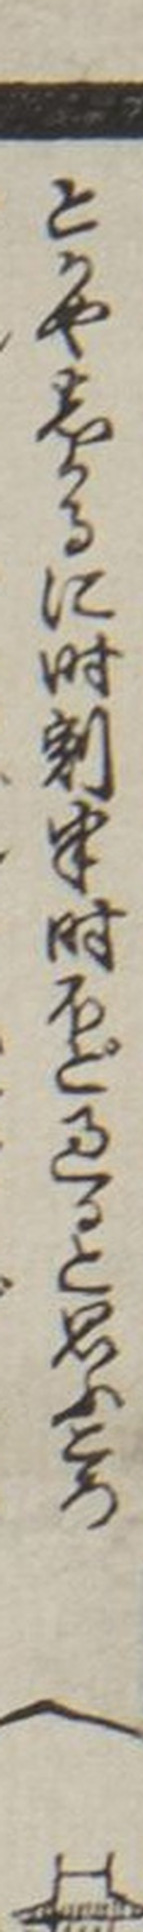とかやしかるに時刻半時ほど過ると思ふころ
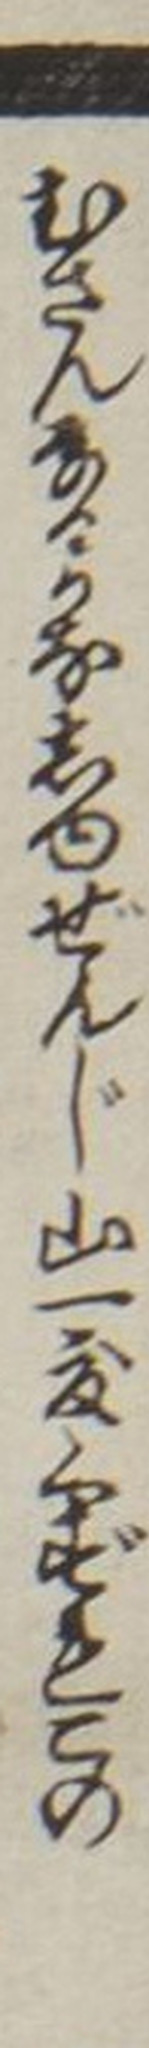むさんなるかなしゆぜんじ山一度くずれこの
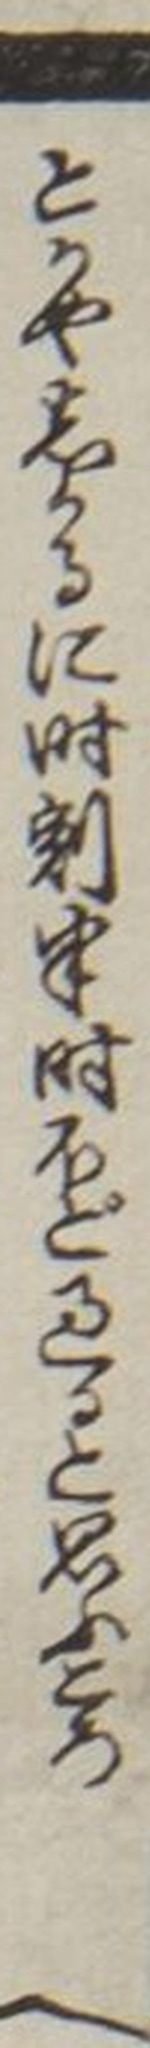とかやしかるに時刻半時ほど過ると思ふころ
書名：十箇国大地震の図
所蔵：あいおいニッセイ同和損保株式会社
